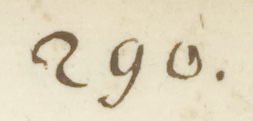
290.
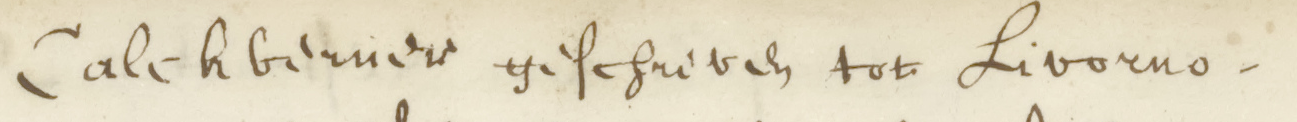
Calckberner geschreven tot Livorno -
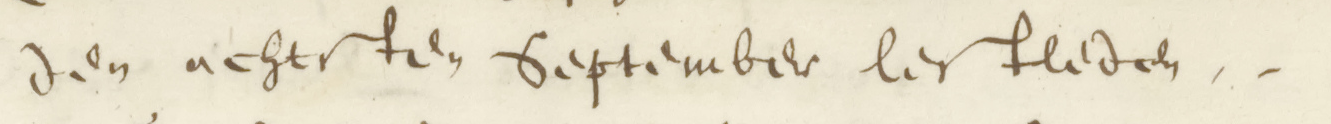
den achtsten September lestleden, -
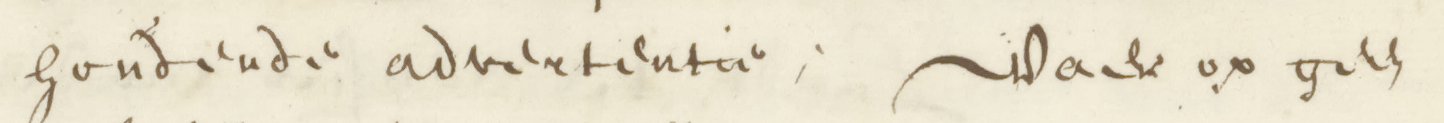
houdende advertentie; Waer op geen
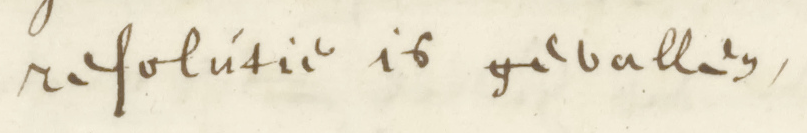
resolutie is gevallen.
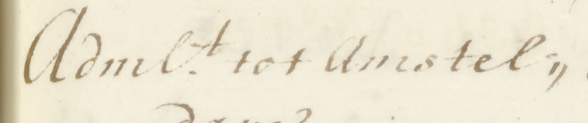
Admlt. tot Amstel,,
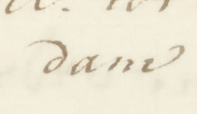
dam
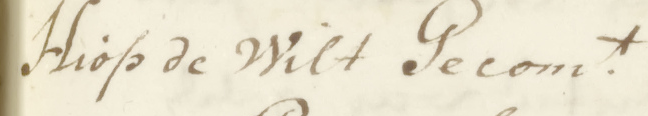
Hiop de Wilt Gecomt.
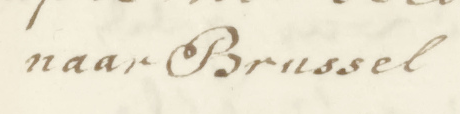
naar Brussel
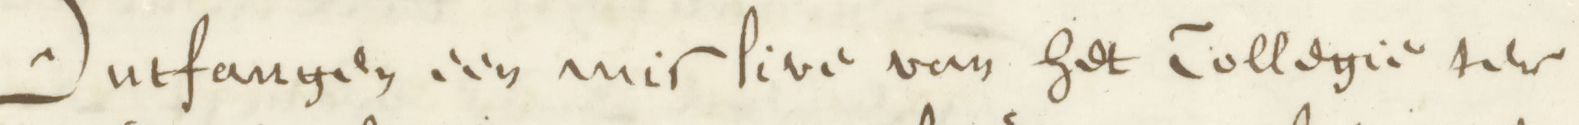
Ontfangen een missive van het Collegie ter
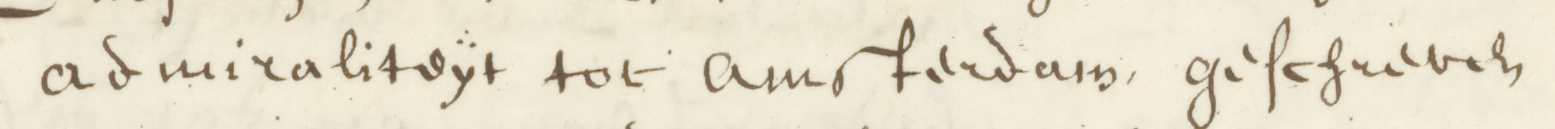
admiraliteijt tot Amsterdam, geschreven
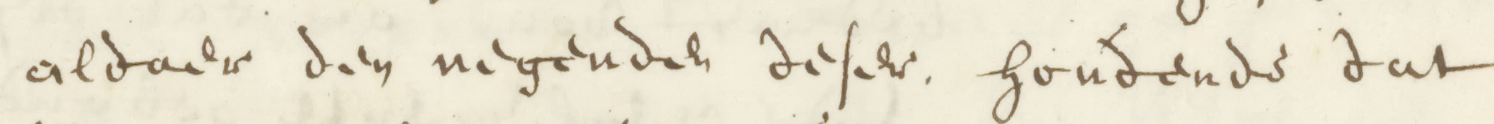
aldaer den negenden deser, houdende dat
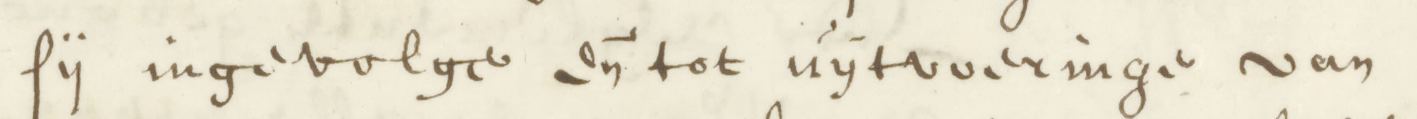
sij ingevolge en tot uijtvoeringe van -
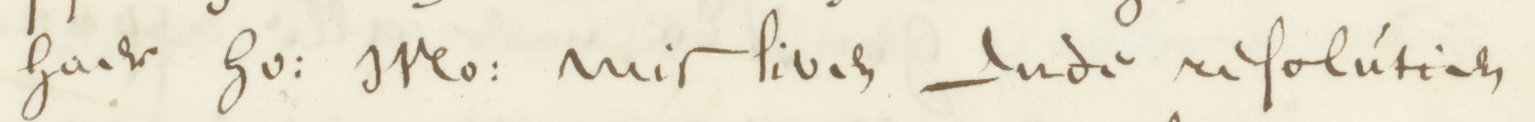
haer ho:Mo: missiven Ende resolutien
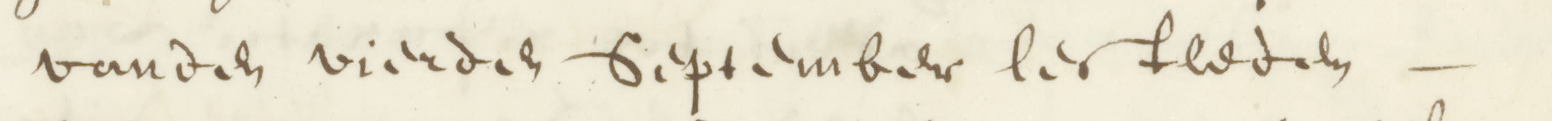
vanden vierden September lestleden —
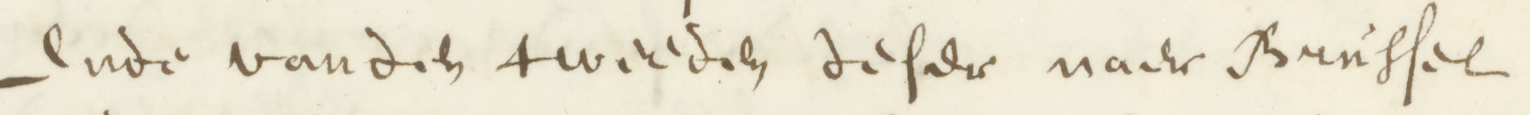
Ende vanden tweeden deser naer Brussel
